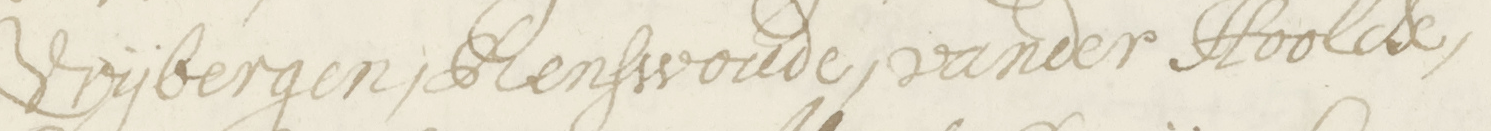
Vrijbergen, Renswoude, vander Hoolck,
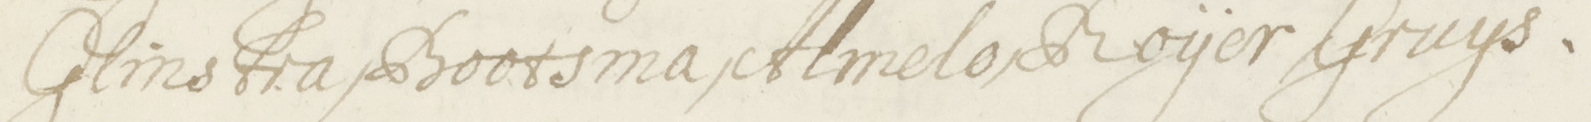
Glinstra, Bootsma, Almelo, Roijer Gruijs.
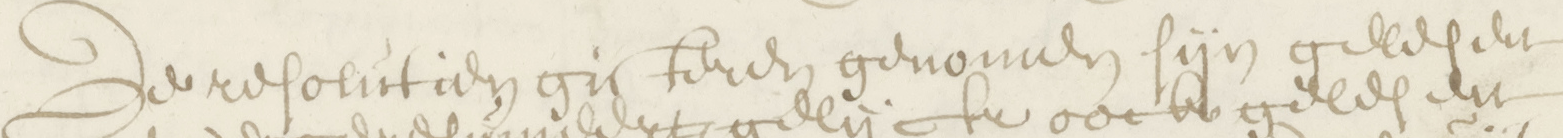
De resolutien gisteren genomen sijn gelesen
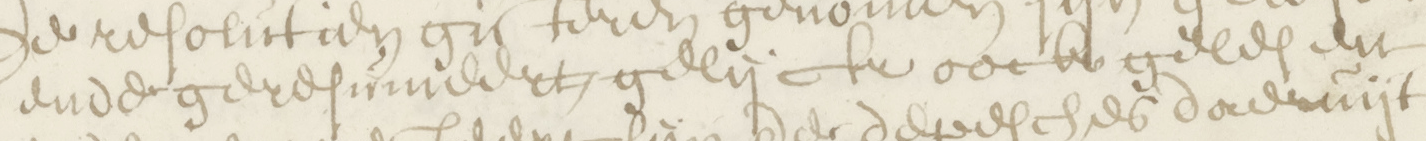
ende geresumeert, gelijck oock gelesen
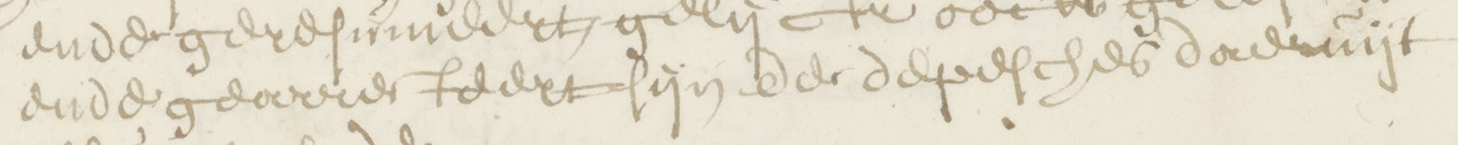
ende gearresteert sijn de depesches daeruijt
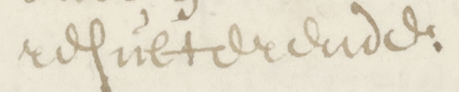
resulterende.
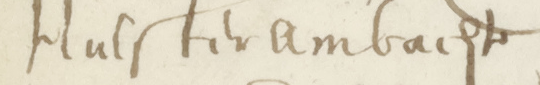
Hulsterambacht
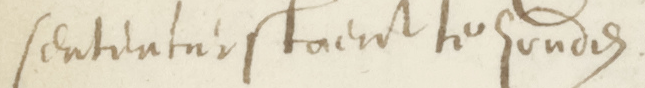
sententie staent te houden
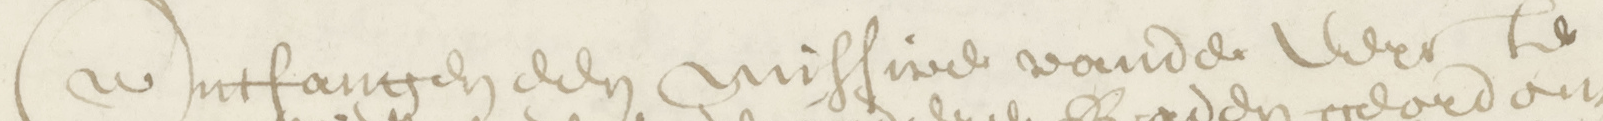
Ontfangen een missive vande eerste
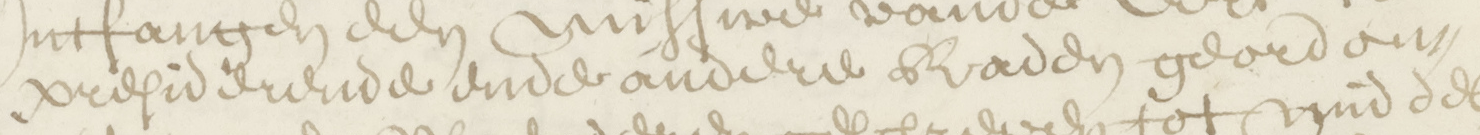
presiderende ende andere raden geordon„,
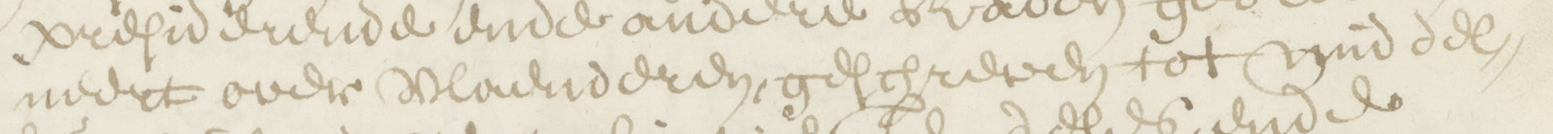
neert over Vlaenderen, geschreven tot middel,
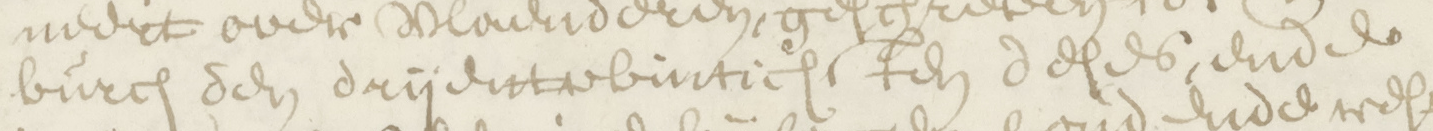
burch den drijentwintichsten deses, ende
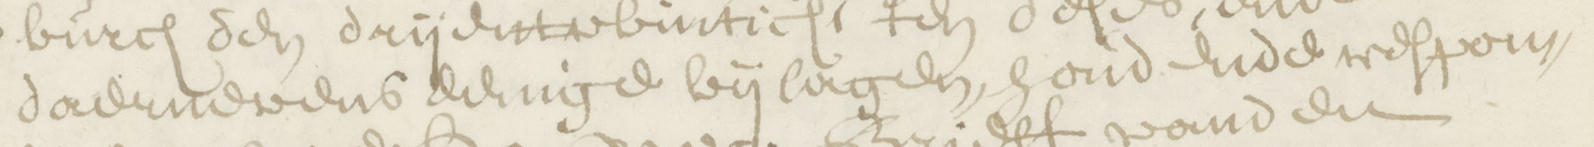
daernevens eenige bijlagen, houdende respon„
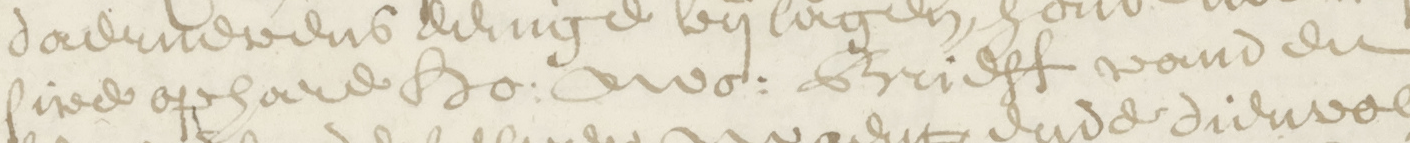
sive op haere Ho:Mo: brieff vanden
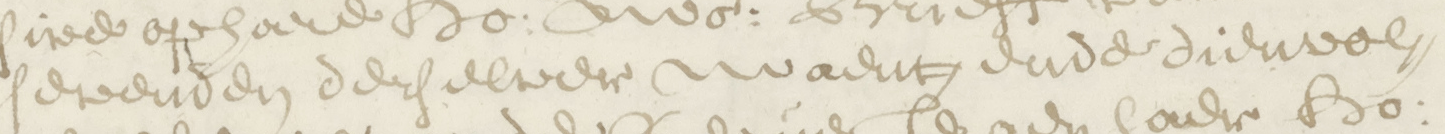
sevenden derselver maent, ende dienvol„
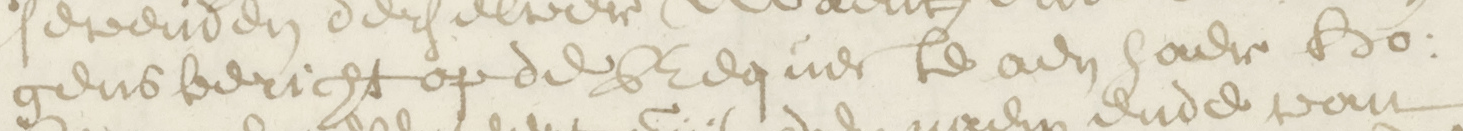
gens bericht opde Requeste aen haer Ho:
